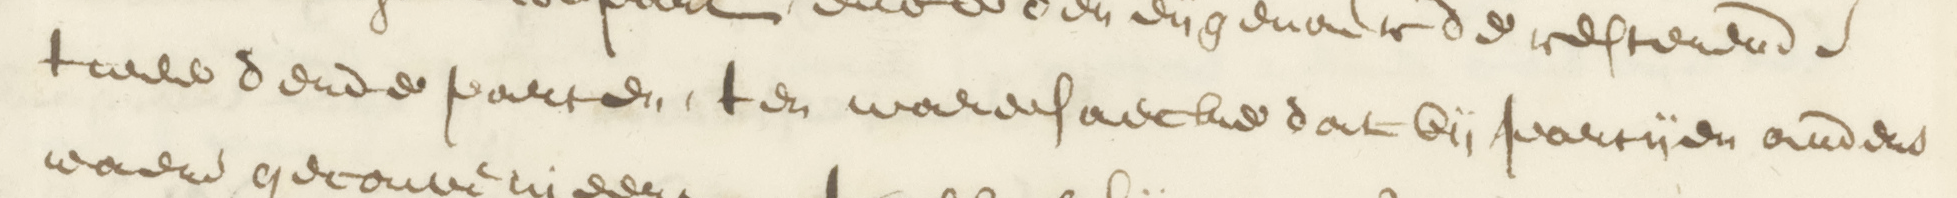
twee derde parten, ten waere saecke dat bij pertijen anders
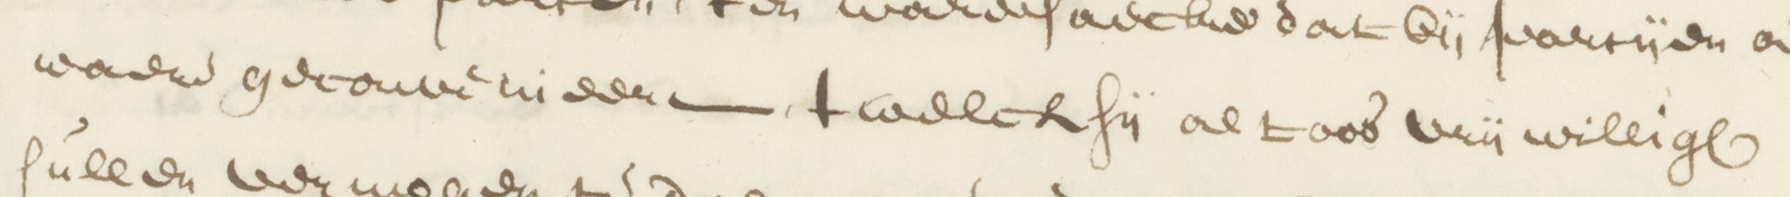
waere geconvenieert, t welck hij altoos vrijwilligh
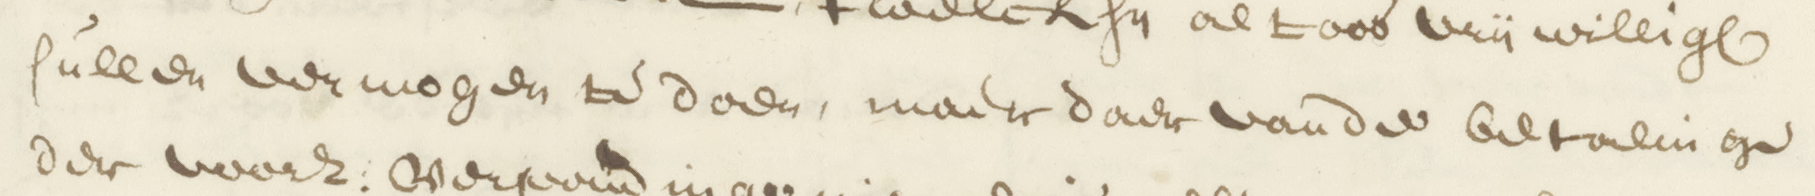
sullen vermogen te doen, maer daer van de betalinge
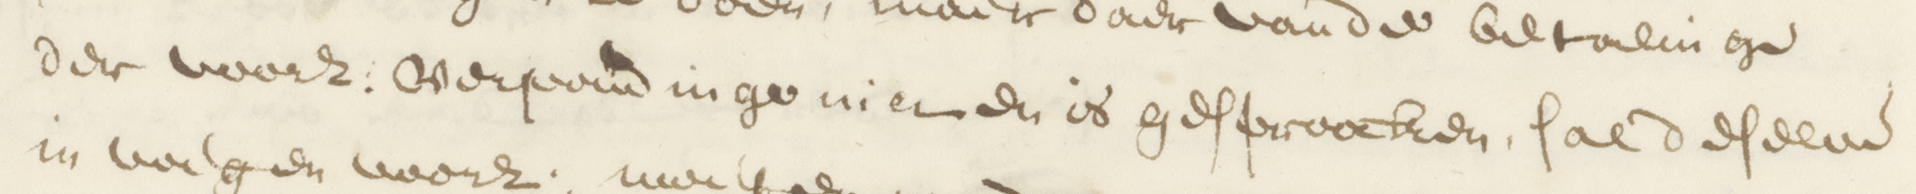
der voorz: verpondinge niet en is gesproocken, sal deselve
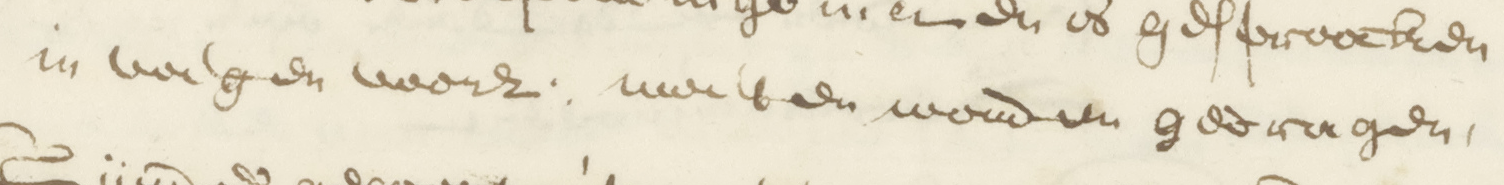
in voegen voorz: moeten worden gedragen.
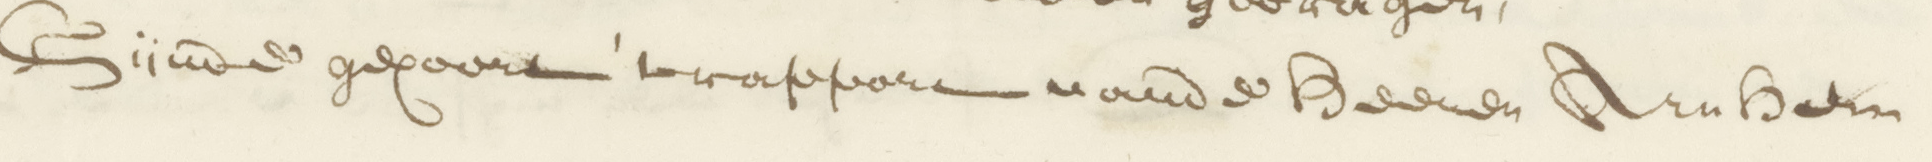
Sijnde gehoort 't rapport vande Heeren Arnhem
